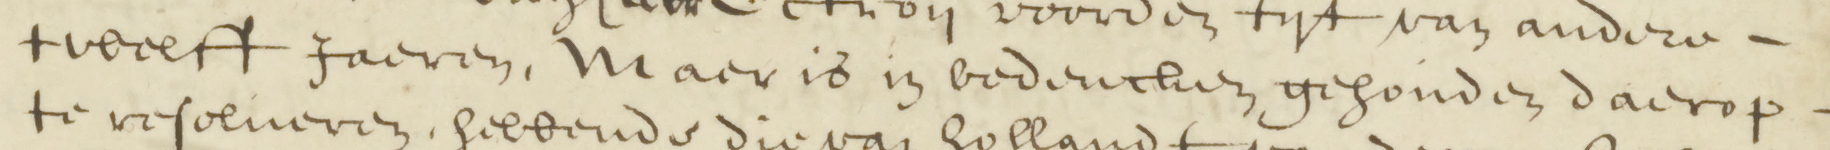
twelff jaeren, Maer is in bedencken gehouden daerop —
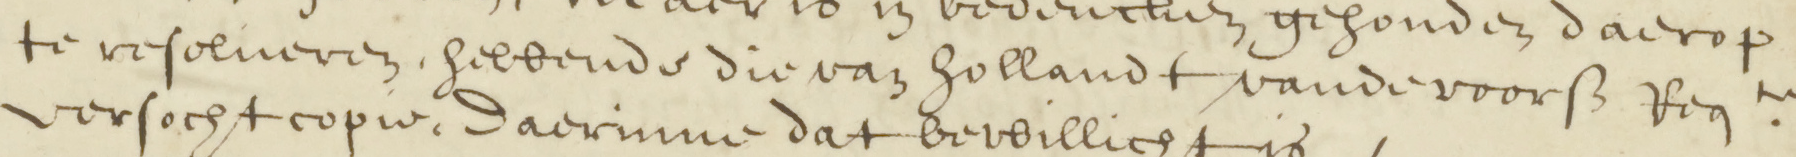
te resolueren, hebbende die van hollandt vande voors Reqte.
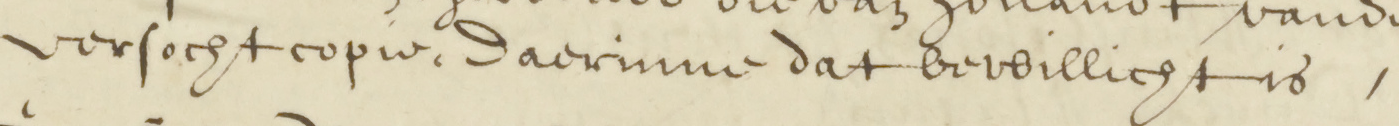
versocht copie, Daerinne dat bewillicht is.
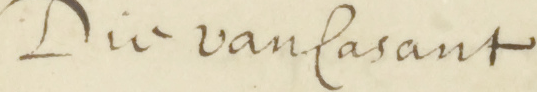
Die van Casant
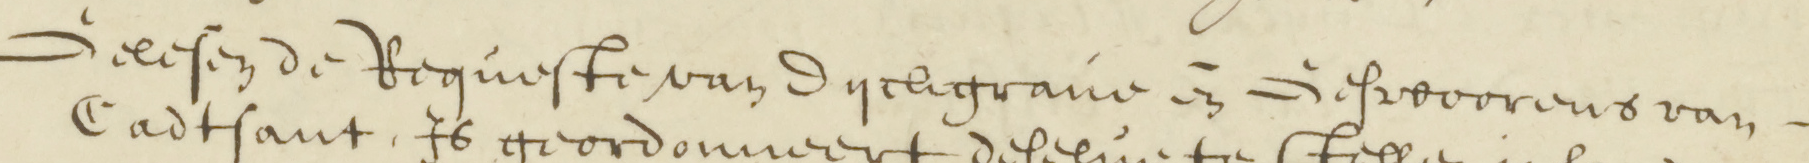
Gelesen de Requeste van Dyckgraue en Geswoorens van —
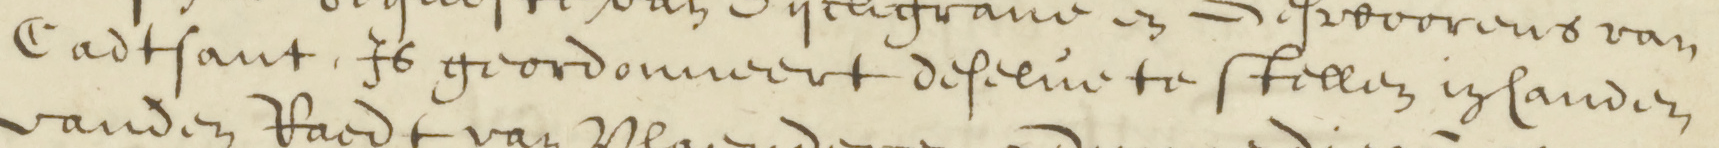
Cadtsant. Is geordonneert deselue te stellen in handen
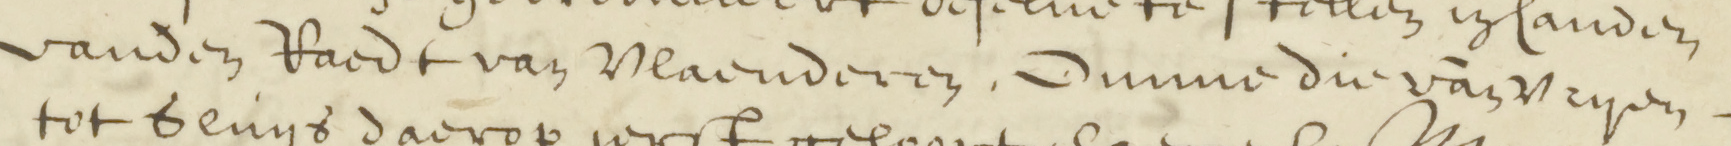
vanden Raedt van Vlaenderen, Omme die van Vryen
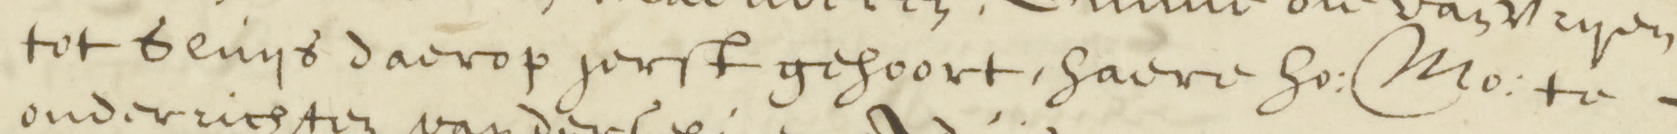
tot Sluys daerop jerst gehoort, haere ho:Mo: te
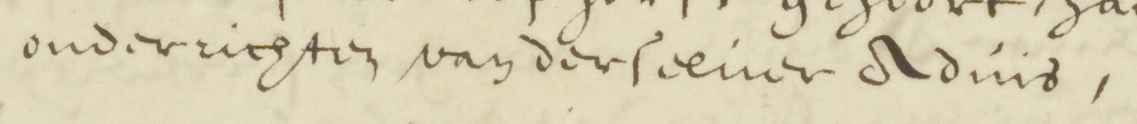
onderrichten van derselver Aduis.
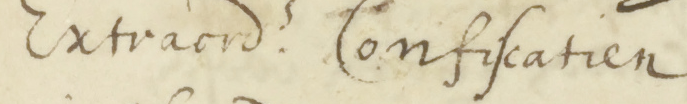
Extaords. Confiscatien
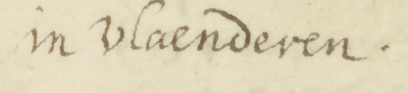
in Vlaenderen.
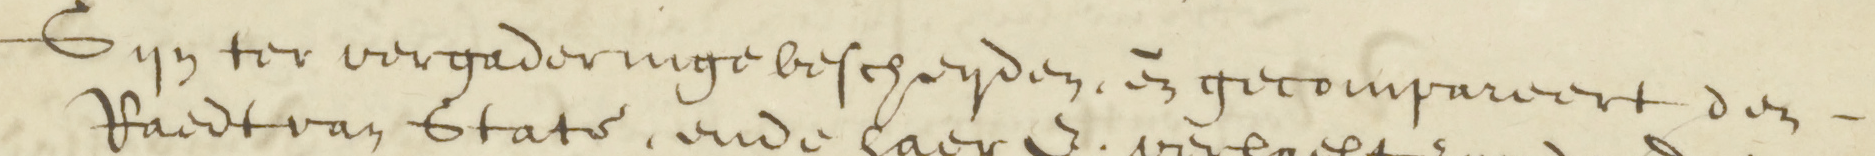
Syn ter vergaderinge bescheyden, en gecompareert den -
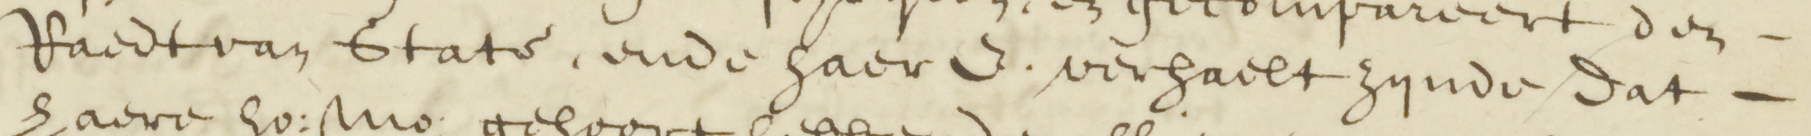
Raedt van State, ende haer E. verhaelt zynde dat —
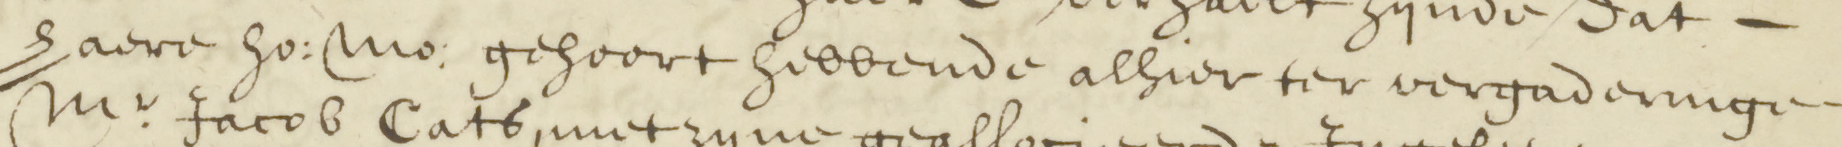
haere ho:Mo: gehoort hebbende alhier ter vergaderinge
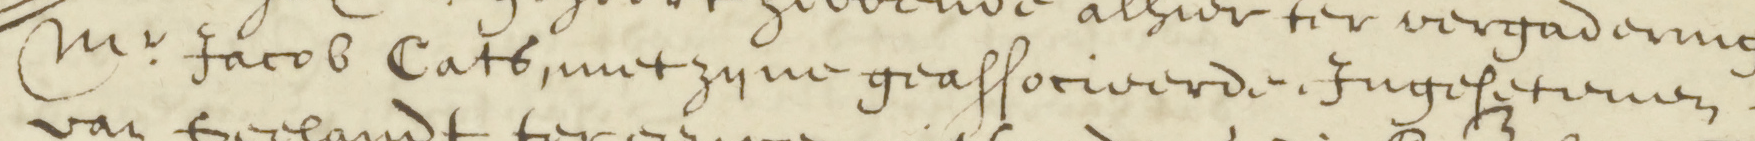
Mr. Jacob Cats, met zyne geassocieerde, Ingesetenen
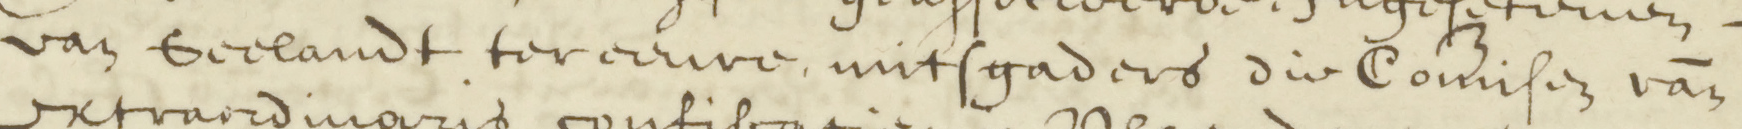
van Seelandt ter eenre, mitsgaders die Comisen van
